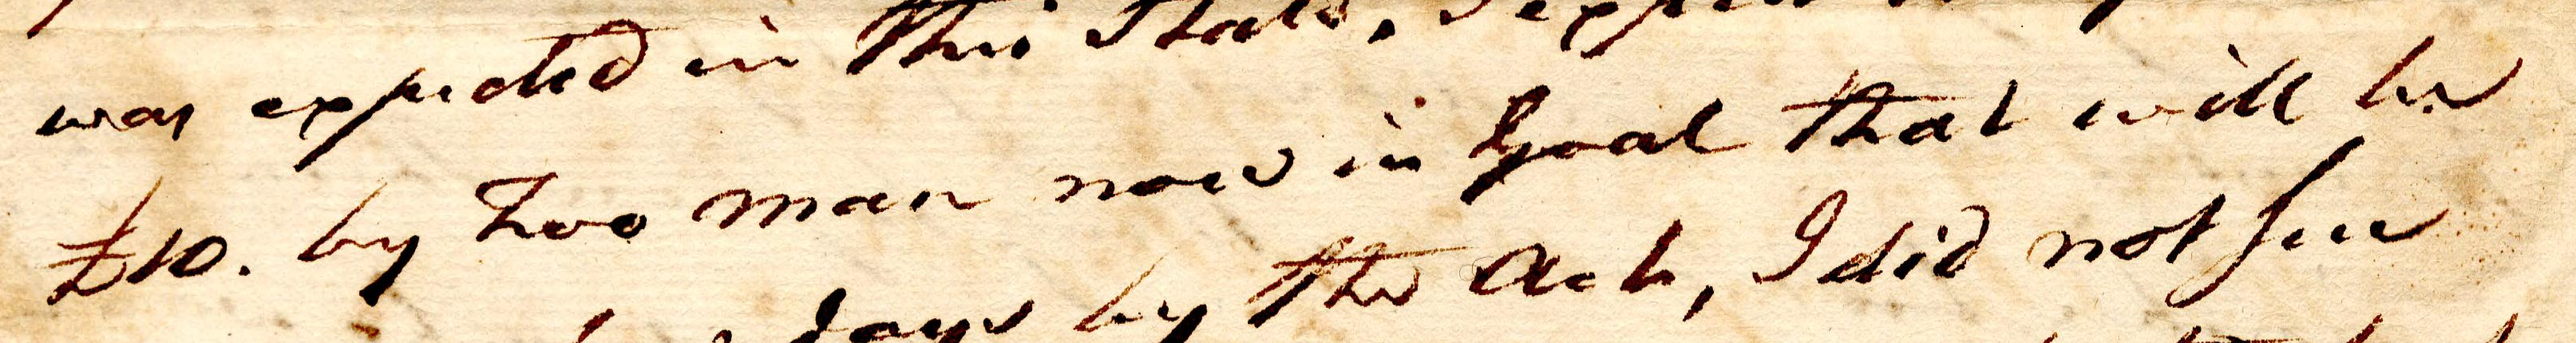£10. by Two men now in Gaol that will be
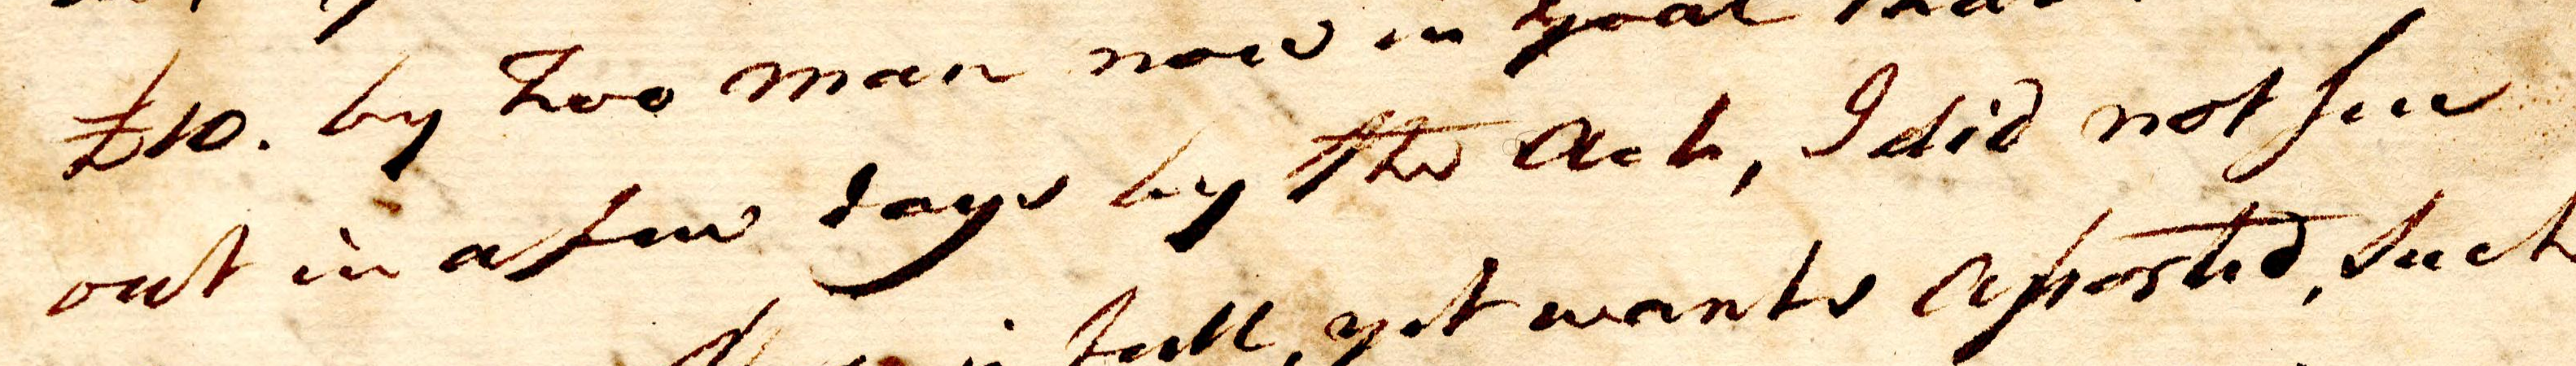out in a few days by the Act, I did not sue
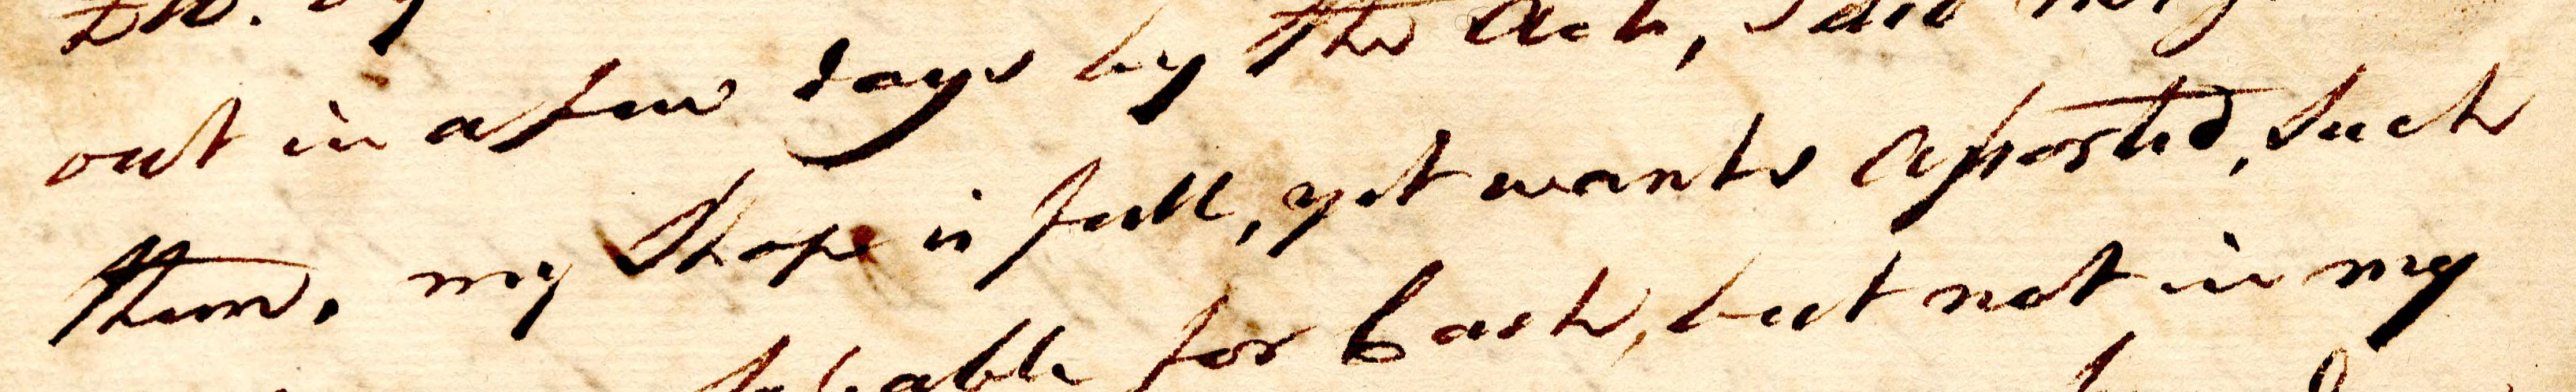them, my shope is full, yet wants assorted, such
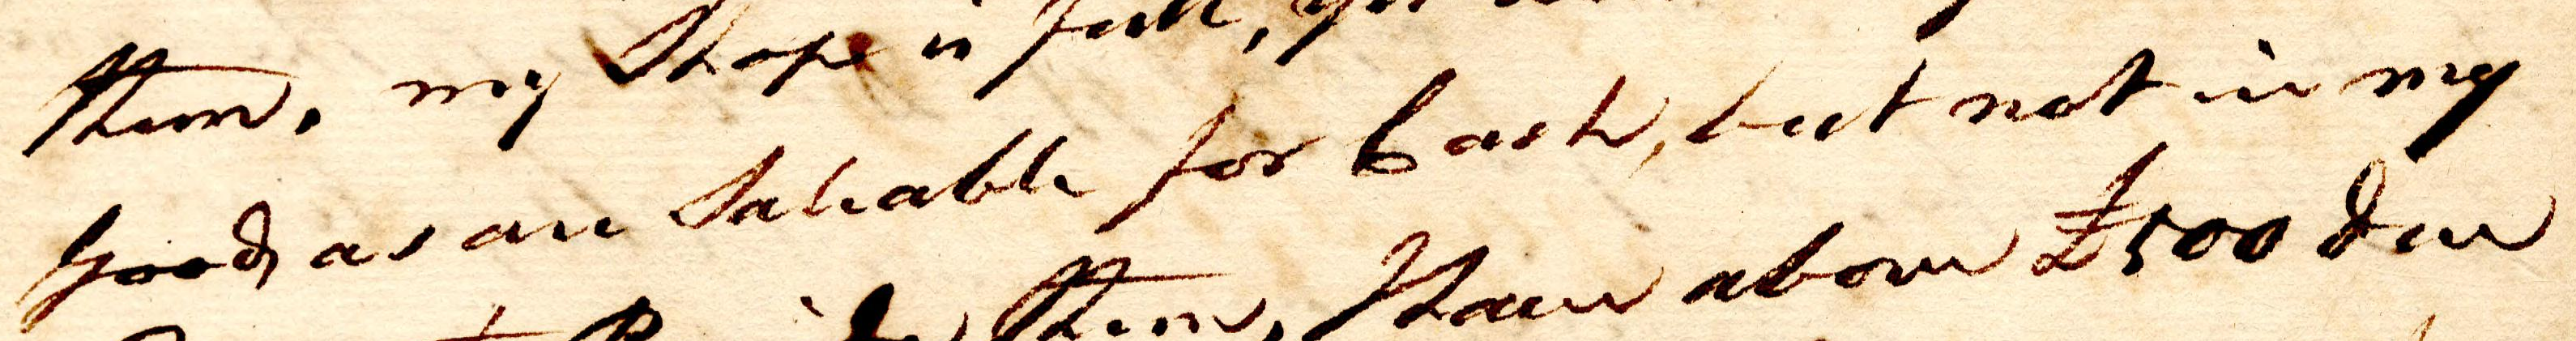Goods as are Saleable for Cash, but not in my
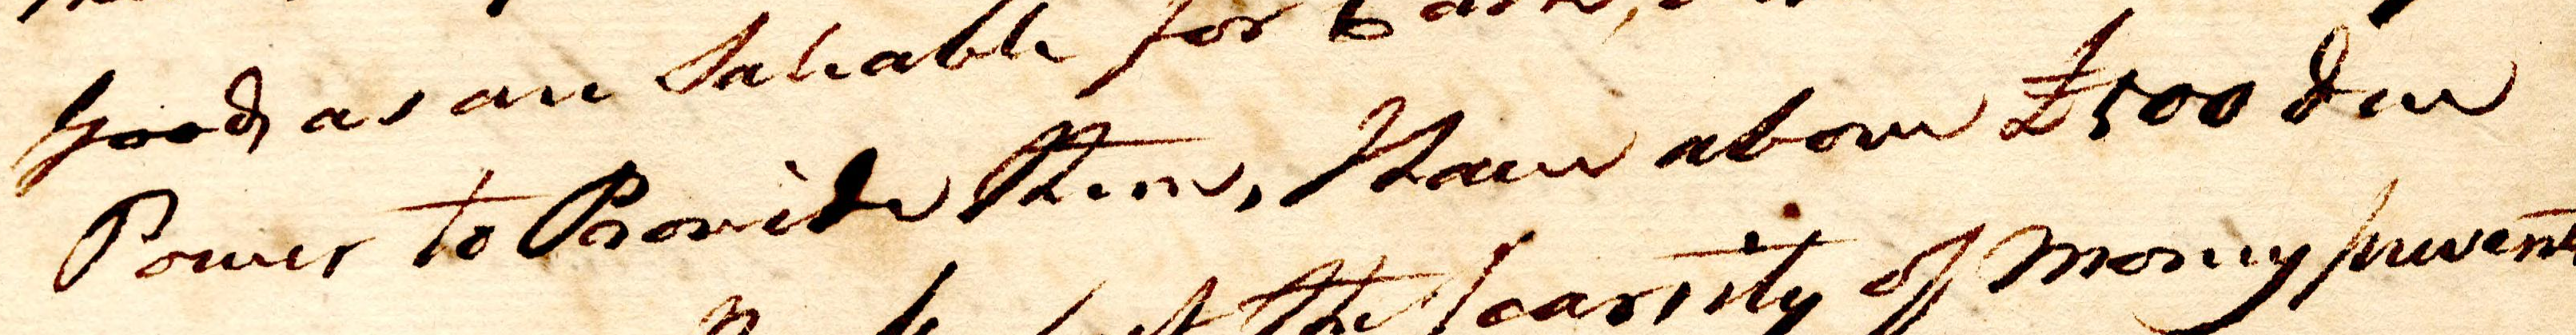Power to Provide thems, I have about £500 due
